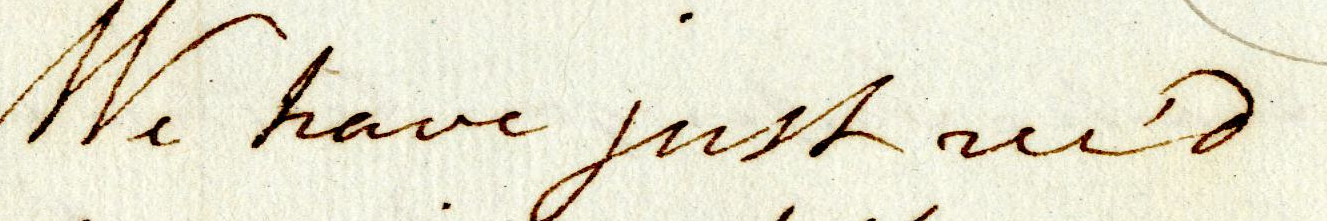We have just rec'd
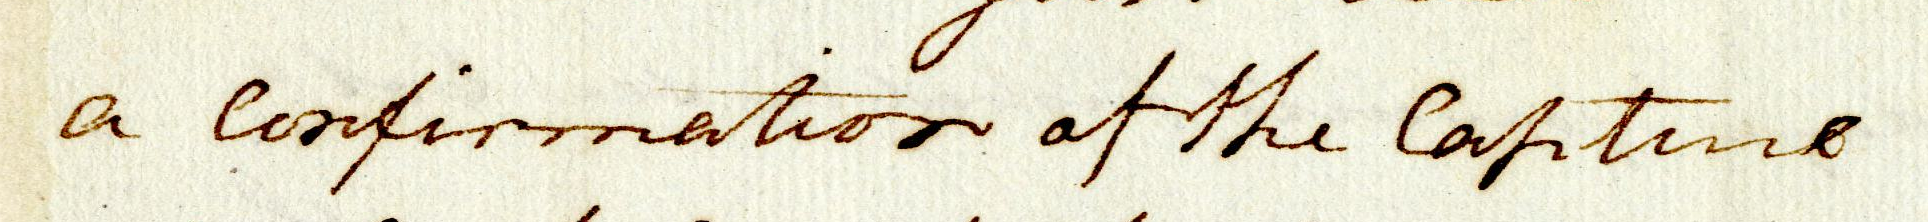a confirmation of the Capture
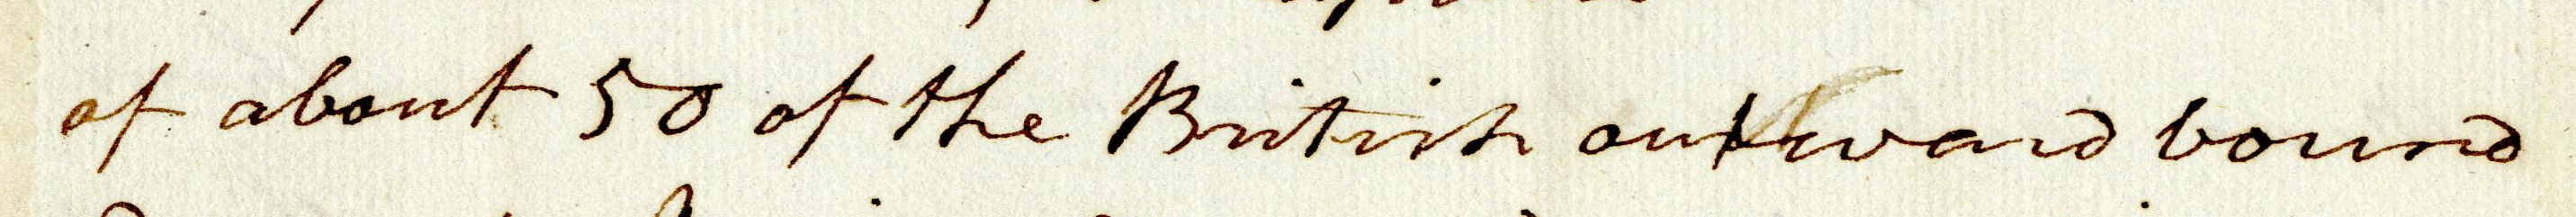of about 50 of the British outward bound
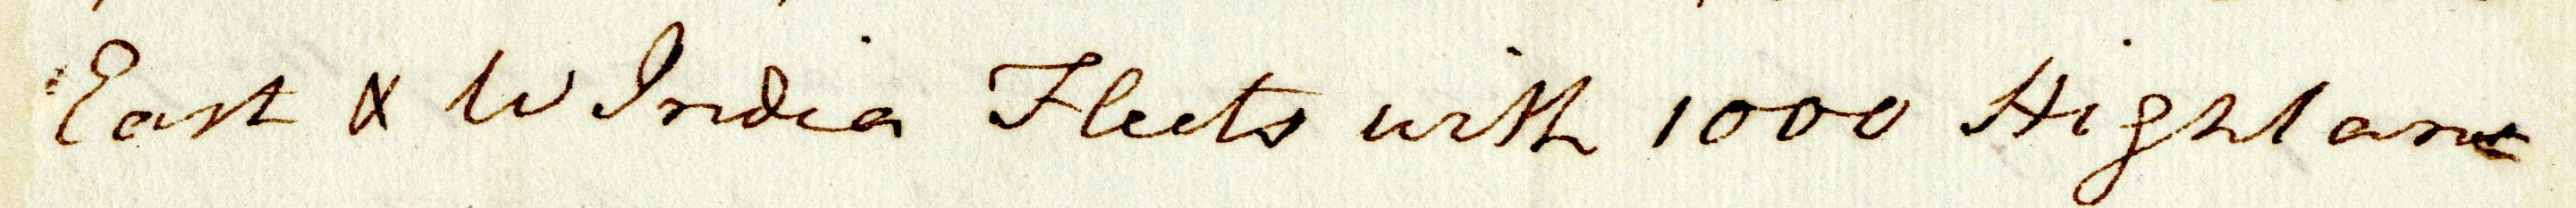East & W India Fleets with 1000 Highlan-
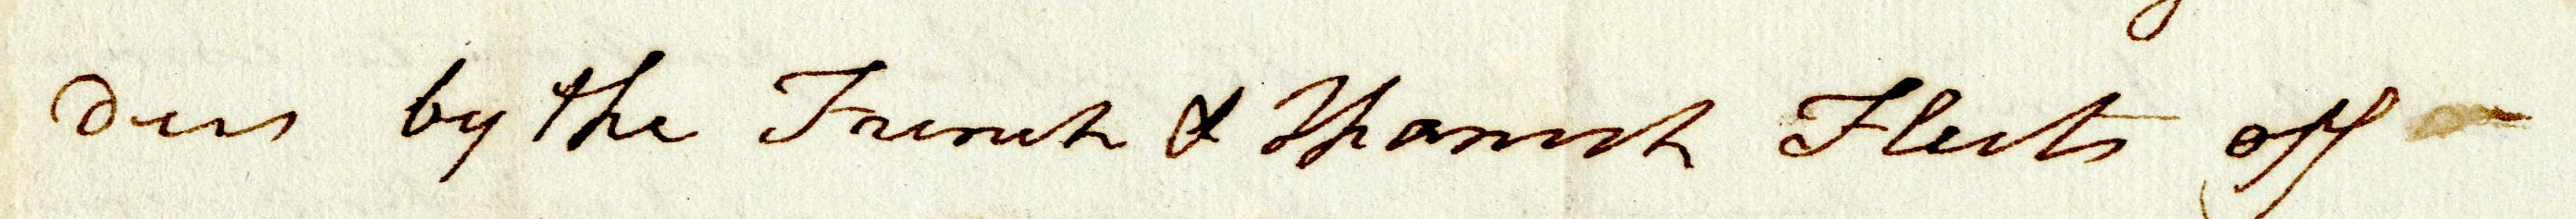ders by the French & Spanish Fleets off
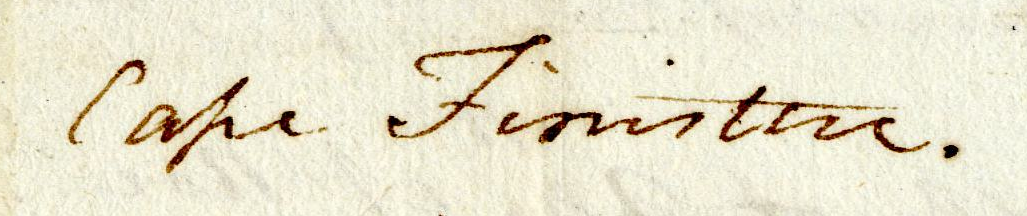Cape Finistere.
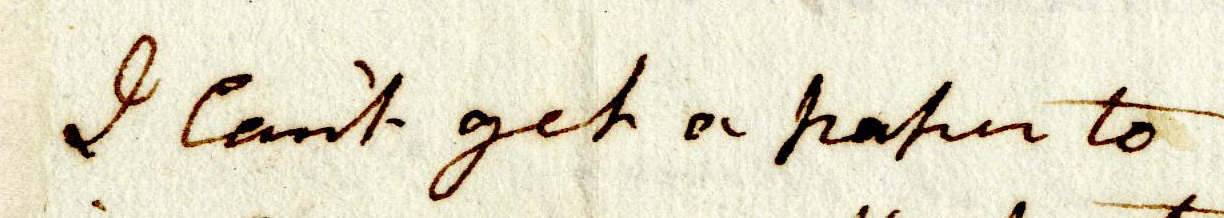I Can't get a paper to
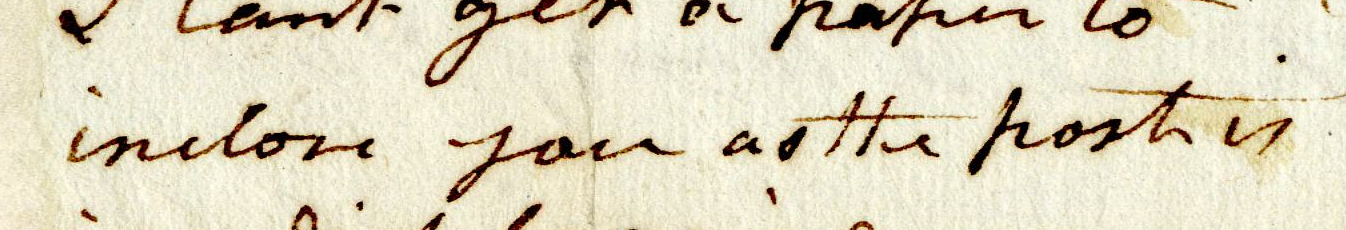inclose you as the post is
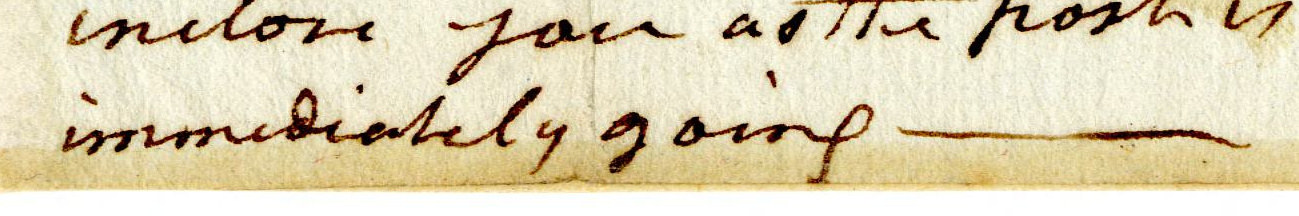immediately going-
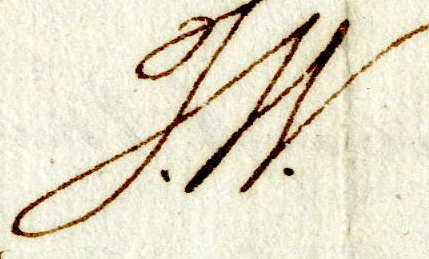J.W.
